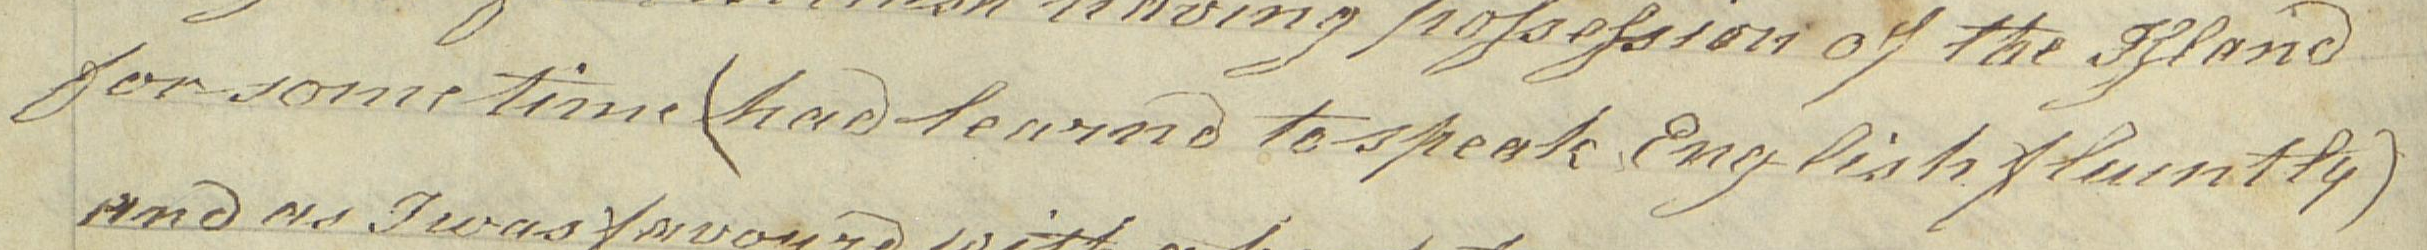for sometime (had learnd to speak English fluently)
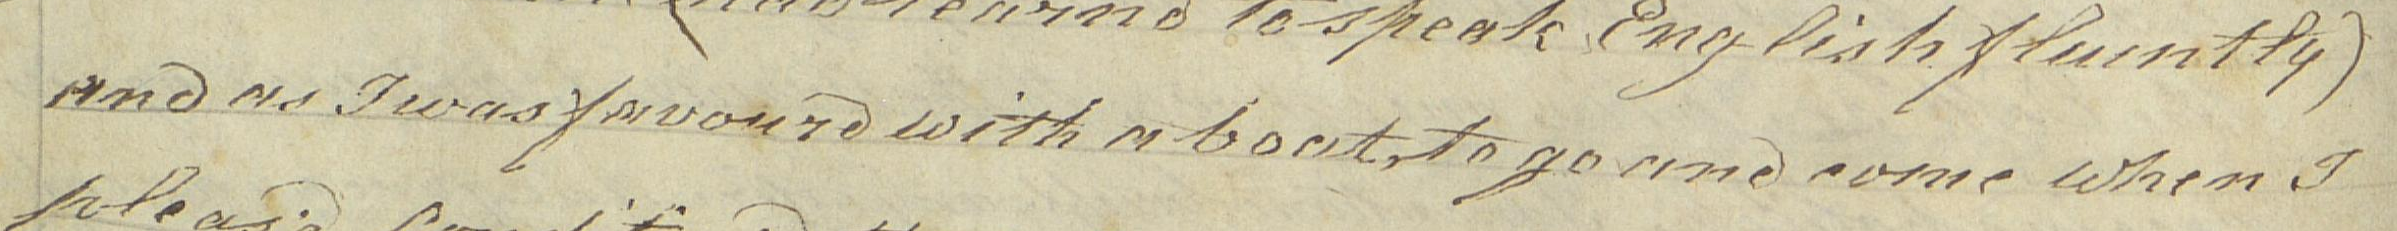and as I was favourd with about to go and come when I
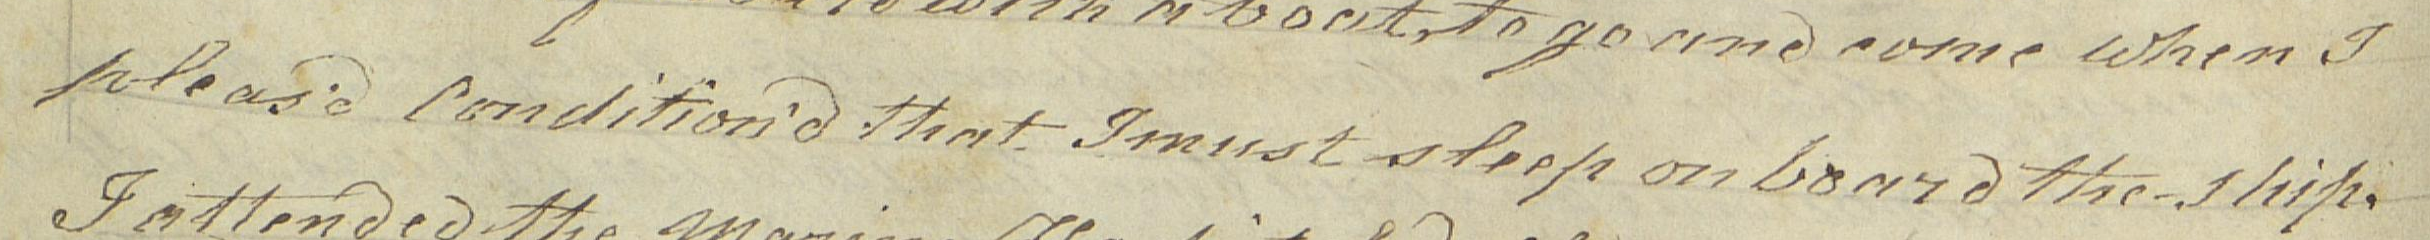pleas'd condition'd that I must sleep on board the ship.
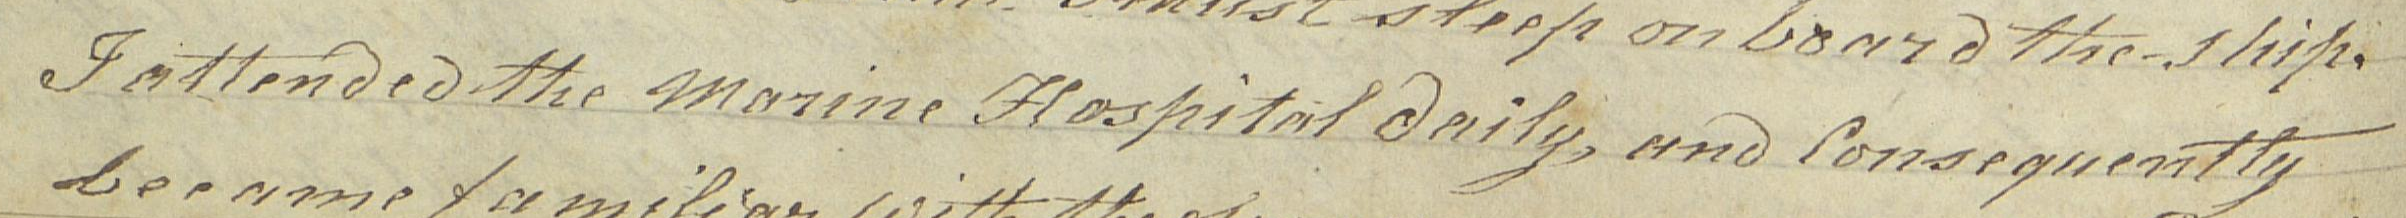I attended the Marine Hospital daily, and Consequently
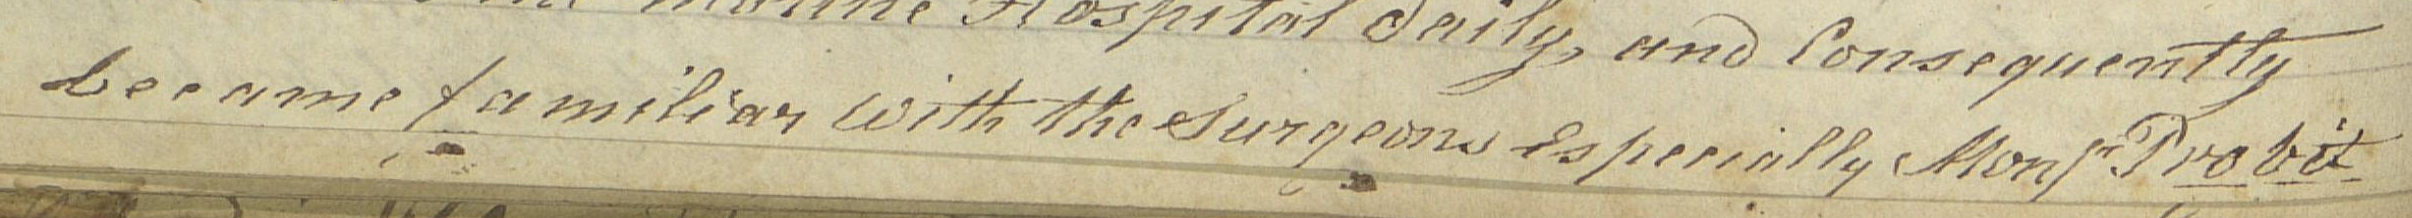became familiar with the Surgeons Especially Mons^r Probit
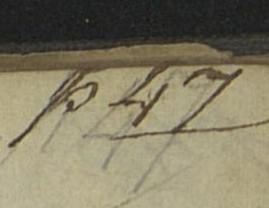p 47
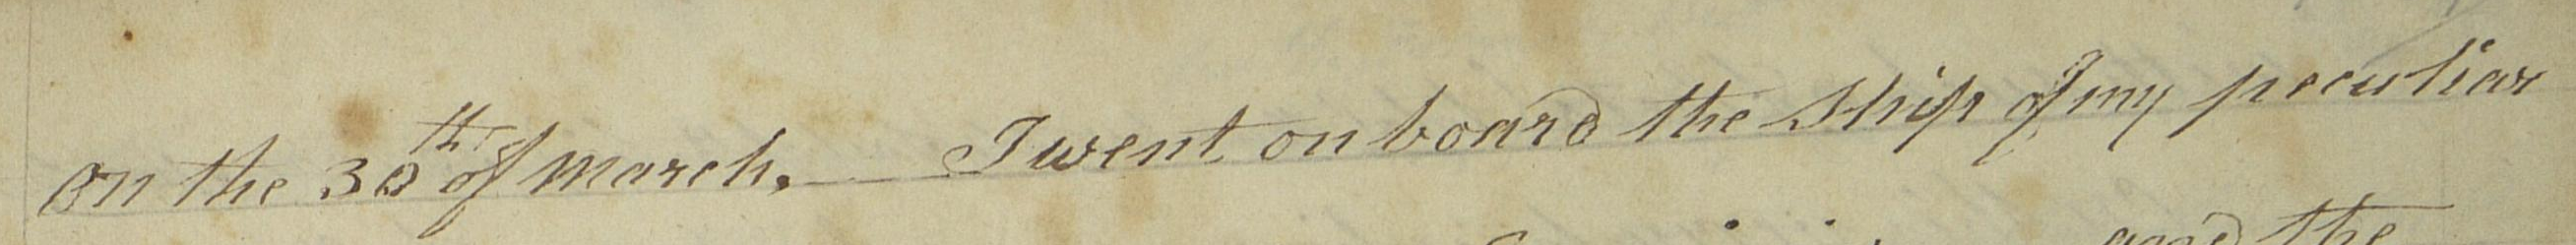on the 30^th of March. I went on board the Ship of my peculiar
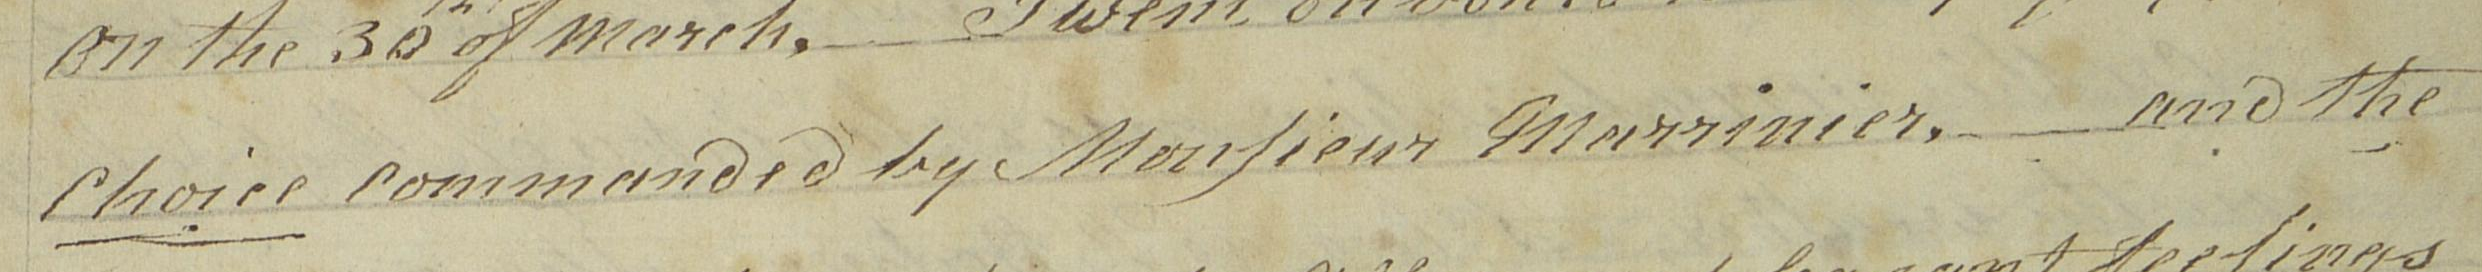choice commanded by Monsieur Marrinier, and the
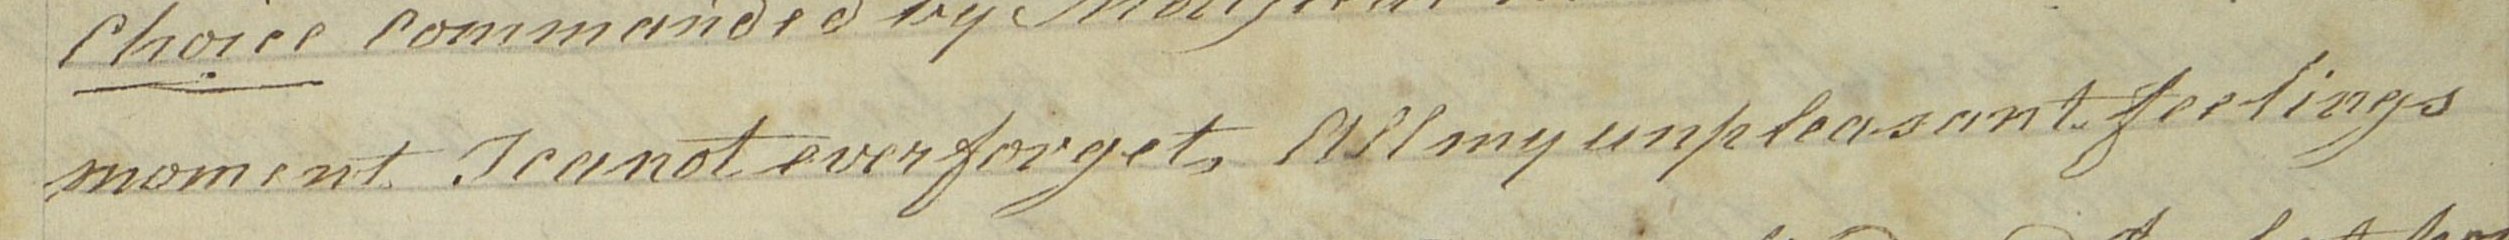moment I canot ever forget, All my unpleasant feelings
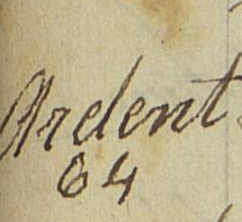Ardent
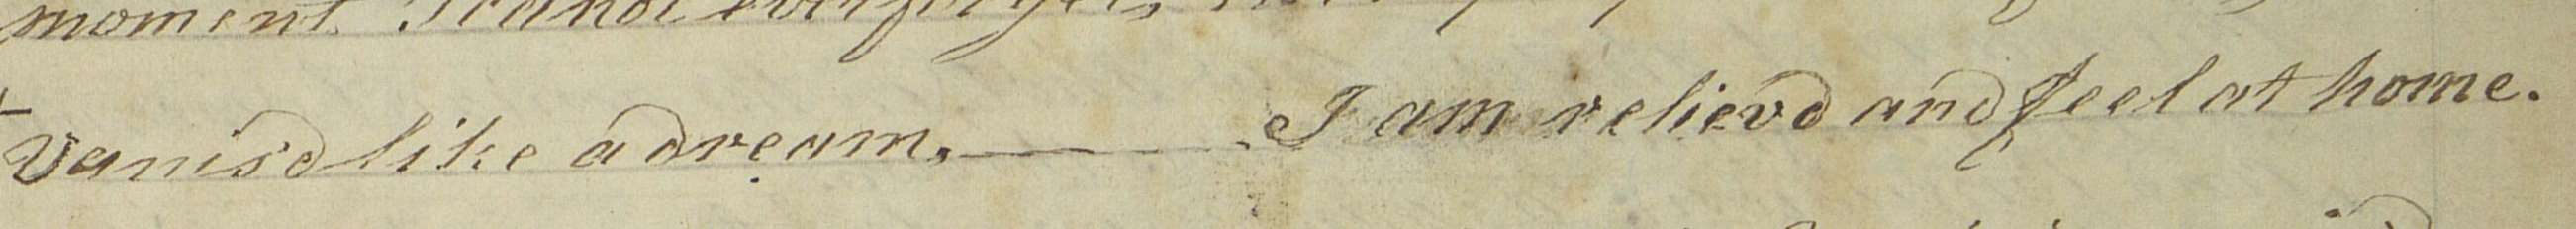vanis'd like a dream. I am relievd and feel at home.
